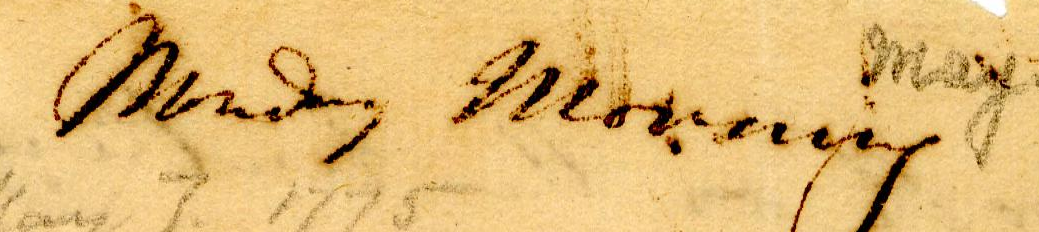Monday Morning
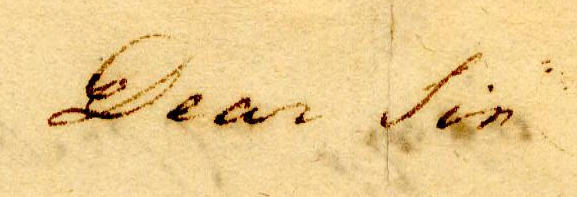Dear Sir
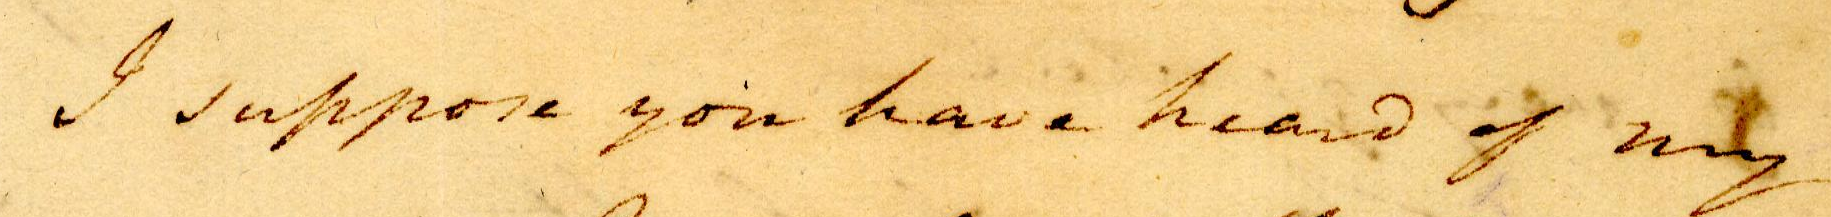I suppose you have heard of my
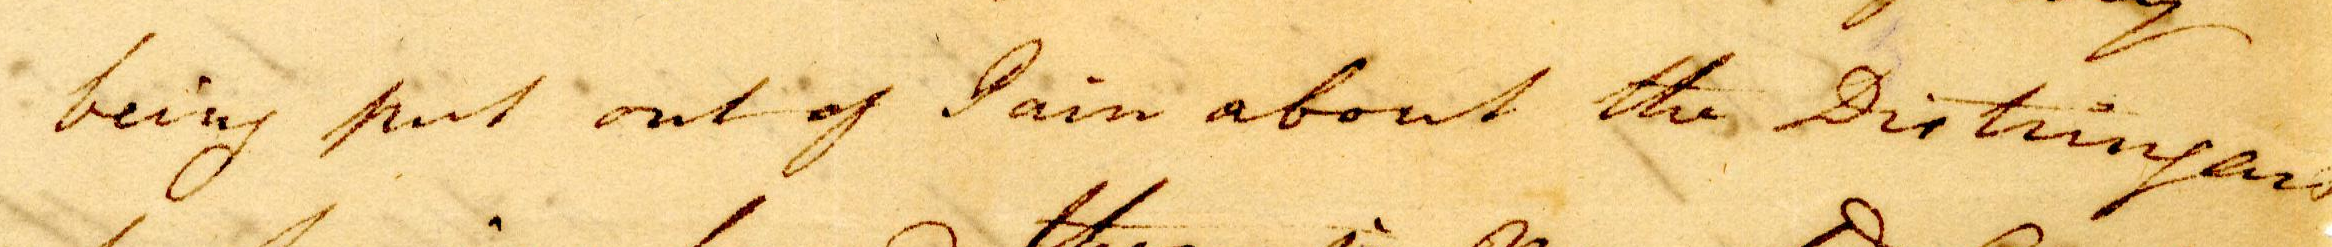being put out of Pain about the Distrin gar
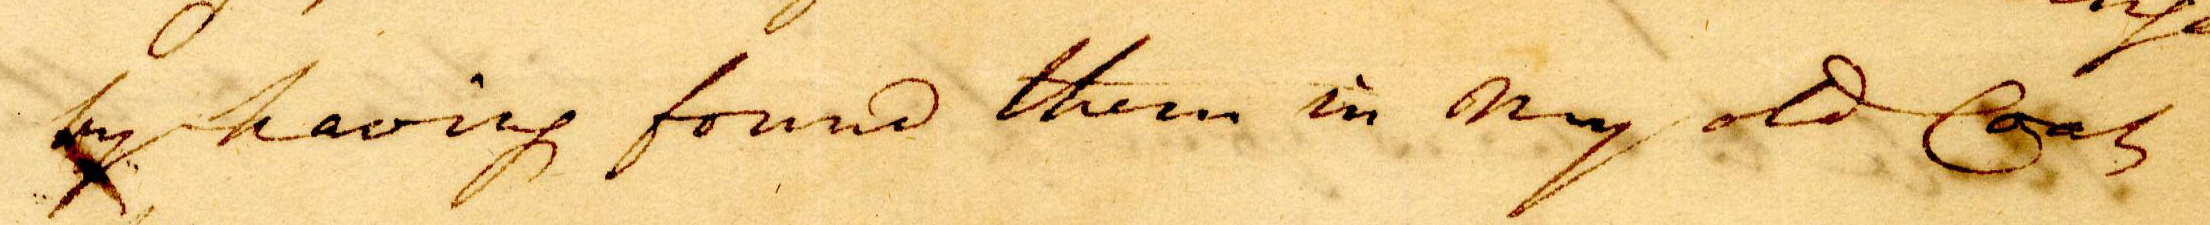by having found them in my old Coat
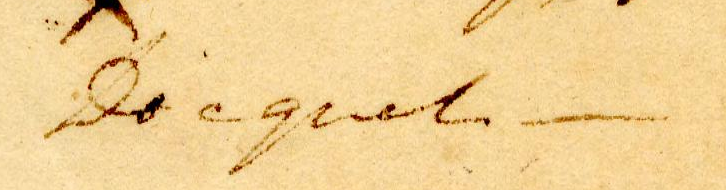Docquet
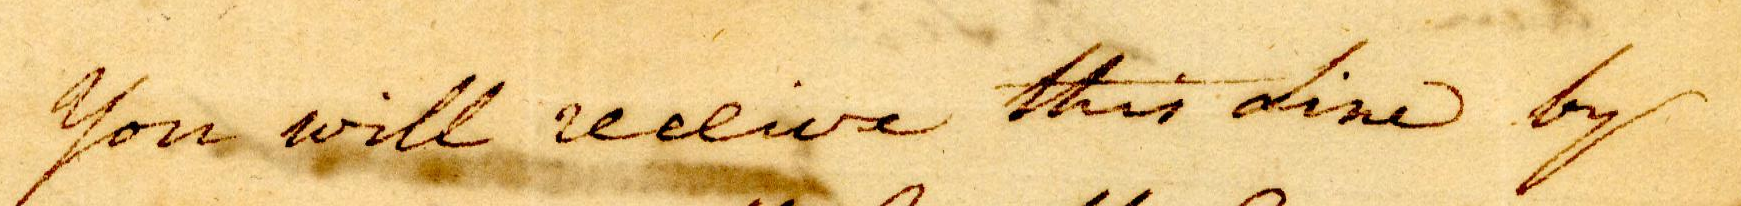You will receive this Line by
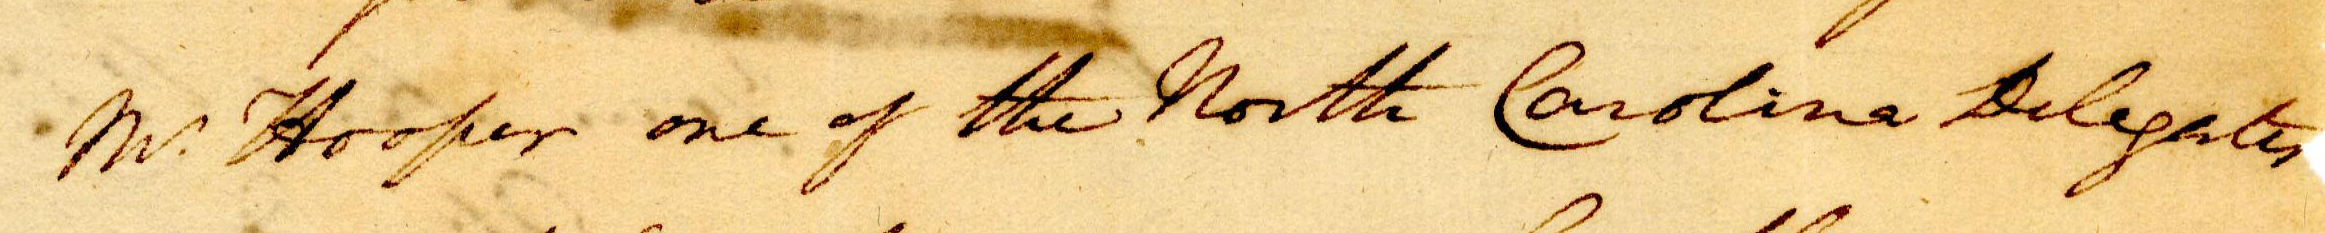M^r. Hooper one of the North Carolina Delegates
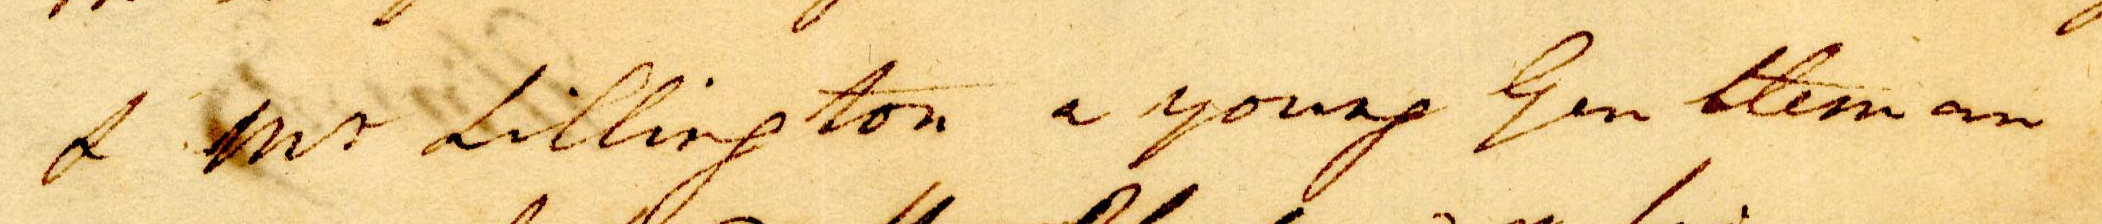& M^rs Lillington a young Gentleman
